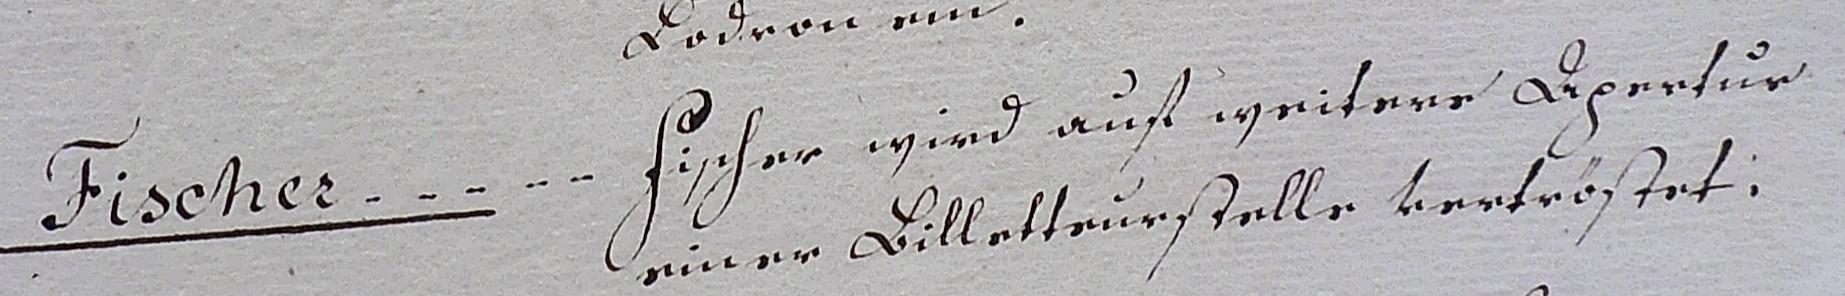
Fischer .. .. .. .. .. Fischer wird auf weitere Apertur
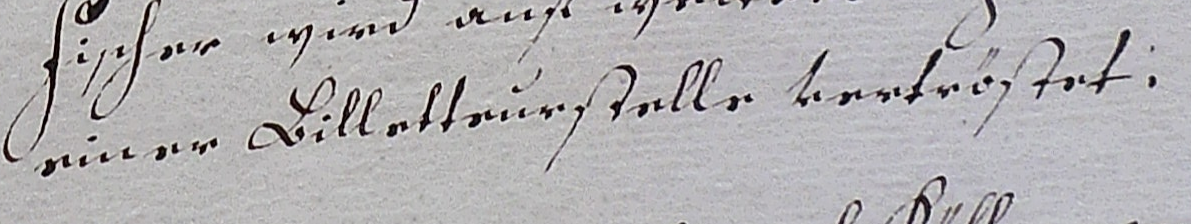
einer Billetteurstelle vertröstet.
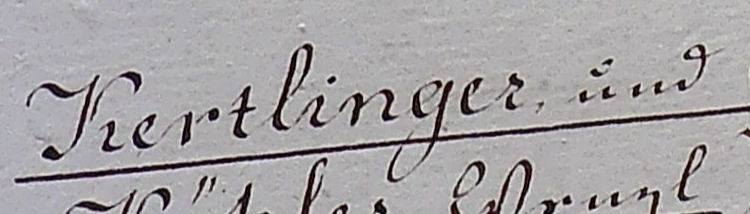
Kertlinger, und
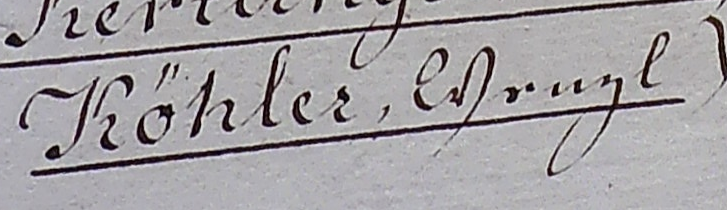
Köhler, Wenzl
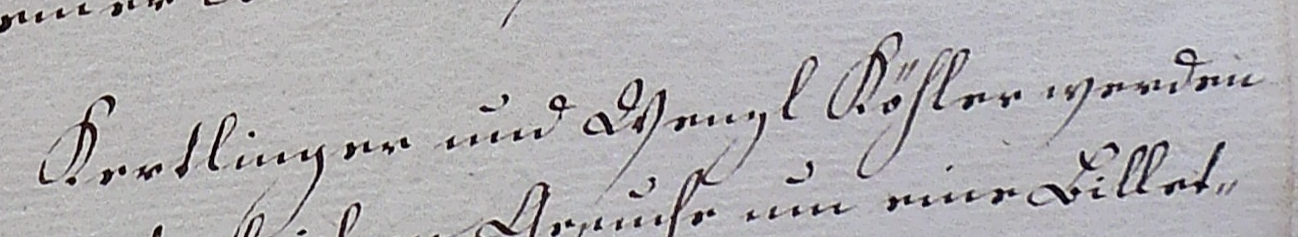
Kertlinger und Wenzl Köhler werden
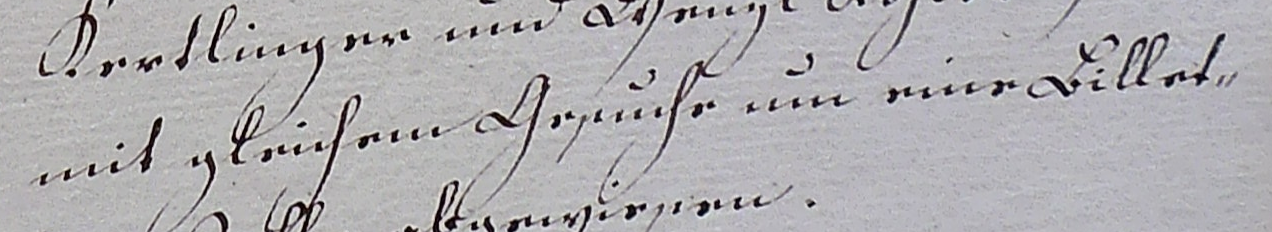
mit gleichem Gesuche um eine Billet¬
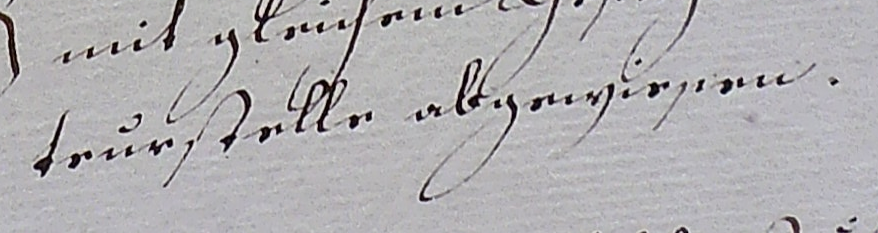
teurstelle abgewiesen.
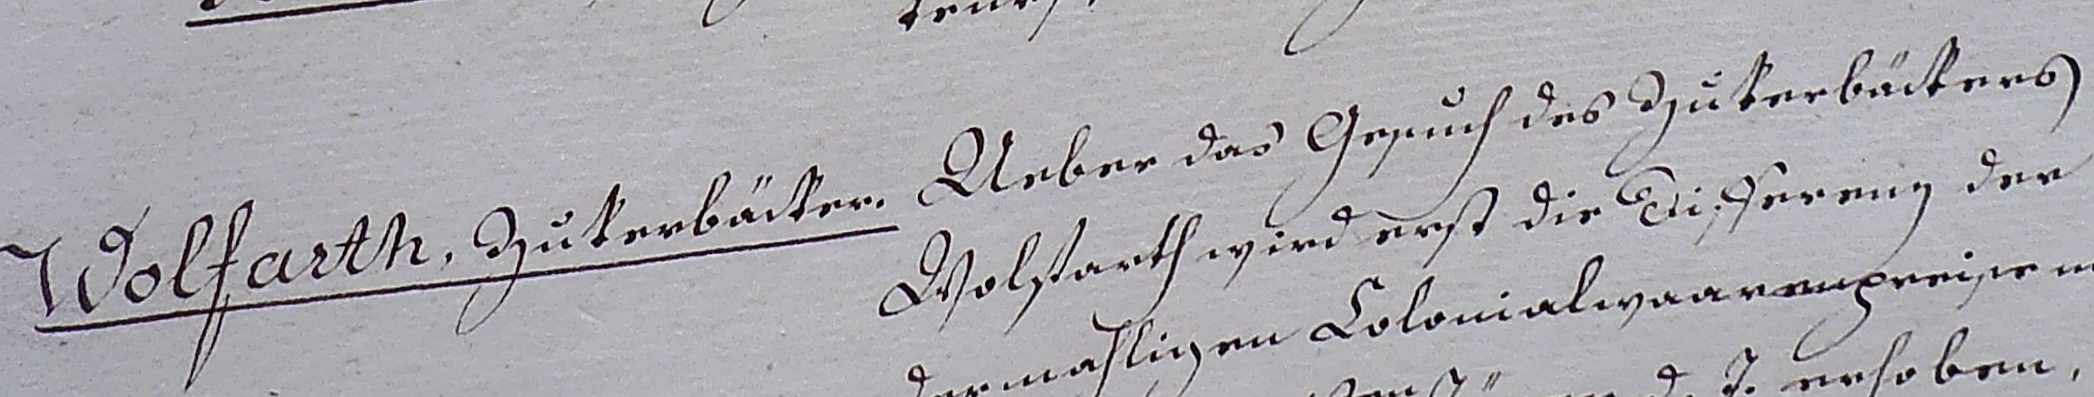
Wolfarth, Zukerbäcker. Ueber das Gesuch des Zukerbäckers
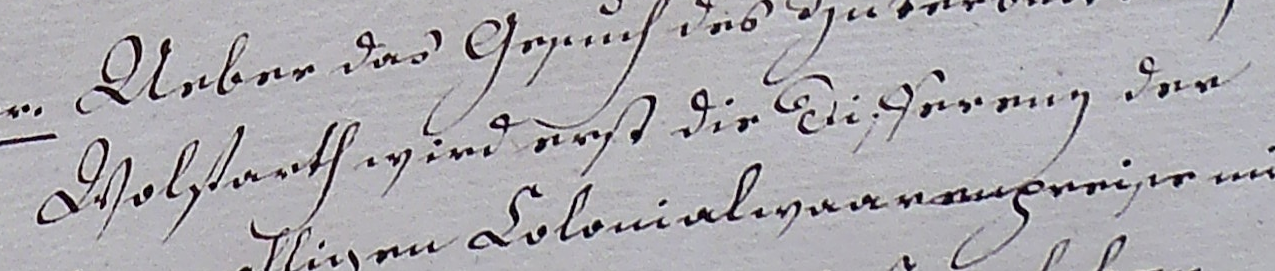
Wolfarth wird erst die Differenz der
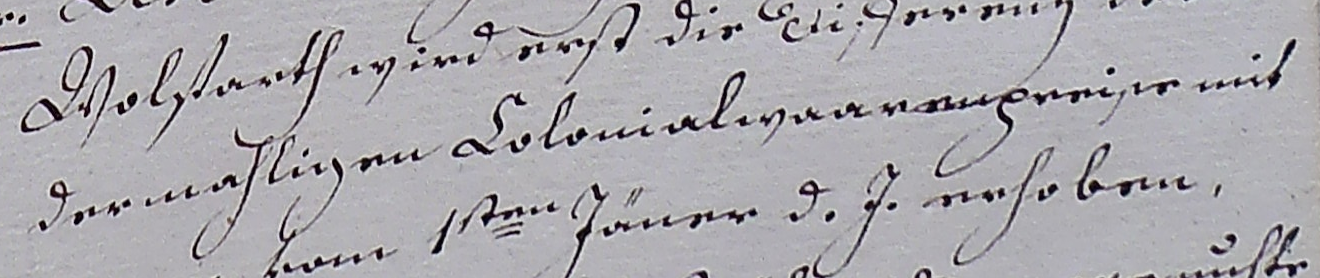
dermahligen Colonialwaarenpreise mit
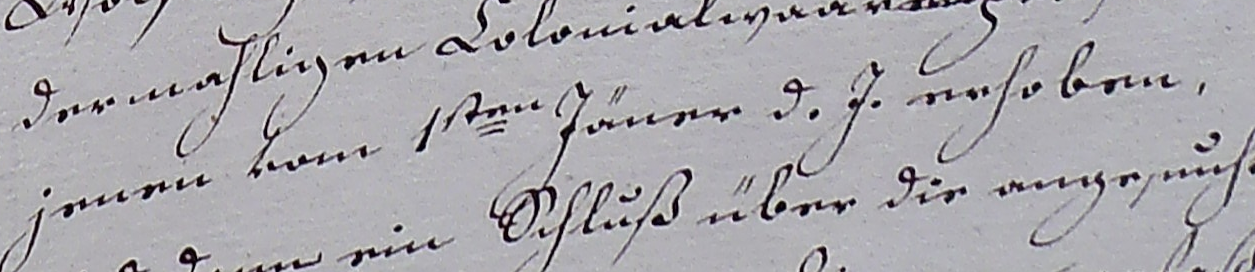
jenen vom 1ste͇n Jäner d. J. erhoben,
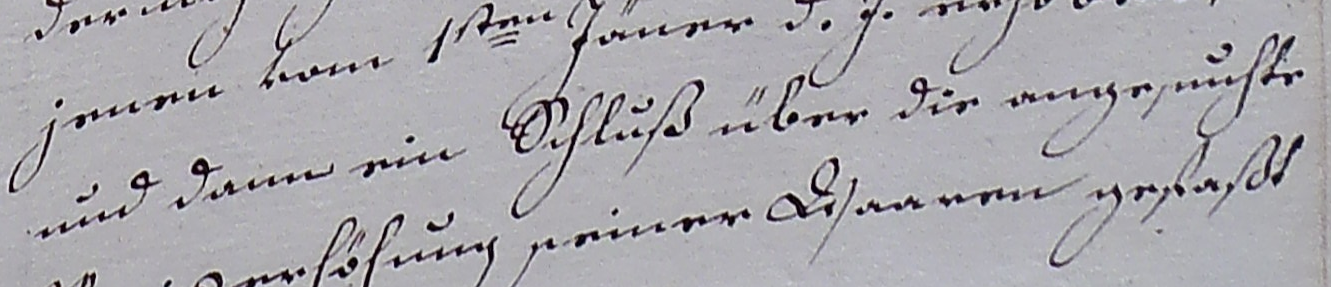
und dann ein Schluß über die angesuchte
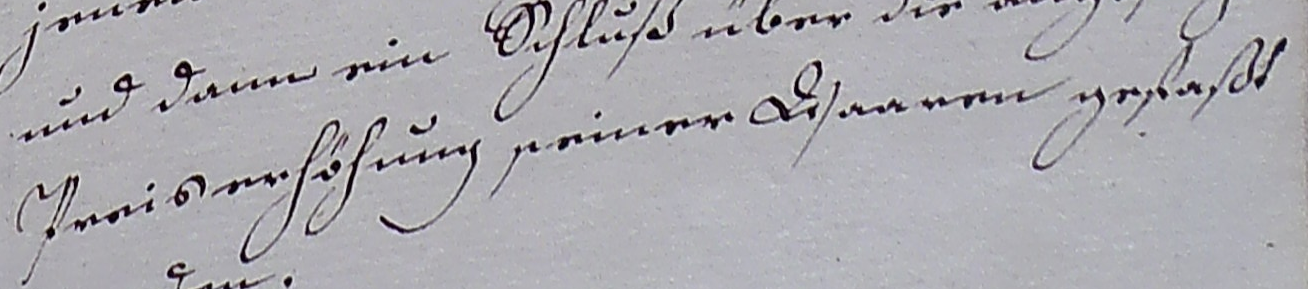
Preiserhöhung seiner Waaren gefaßt
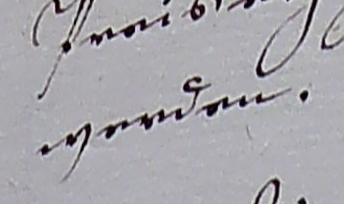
werden.
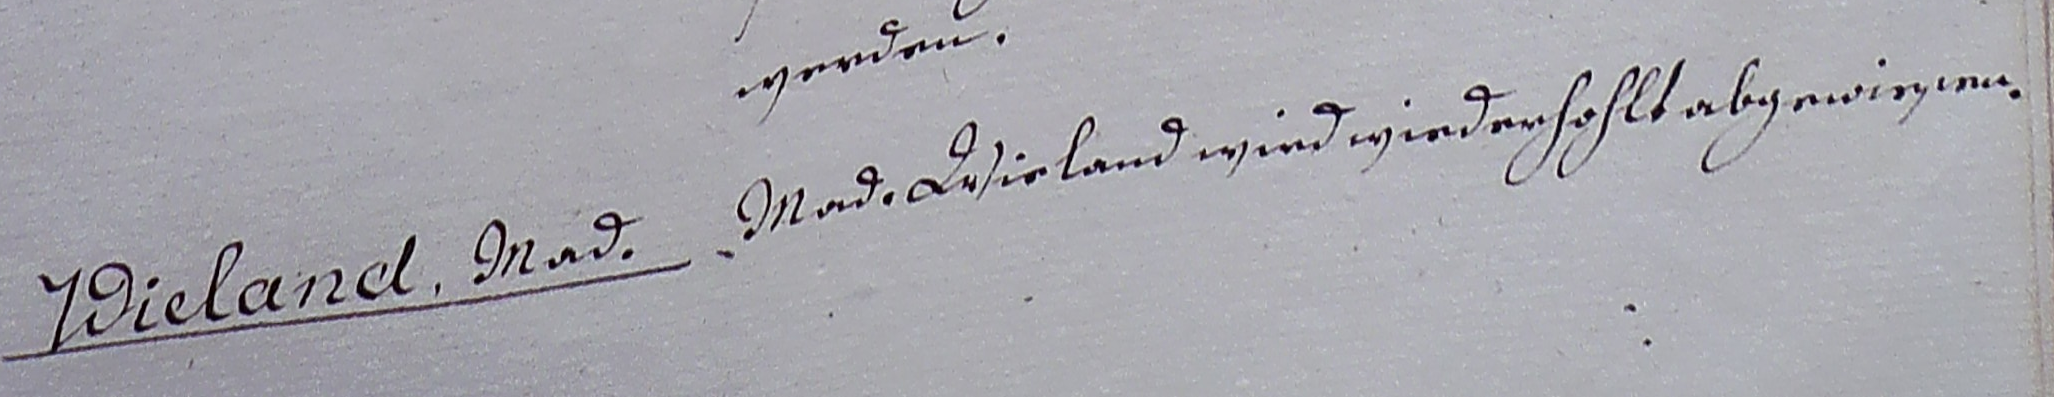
Wieland, Mad. Mad. Wieland wird wiederhohlt abgewiesen.
